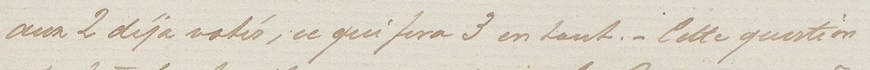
aux 2 déja votés, ce qui fera 3 en tout. – Cette question
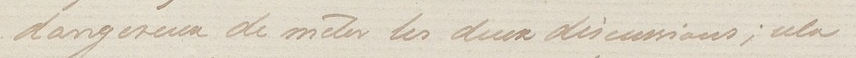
dangereux de mêler les deux discussions; cela
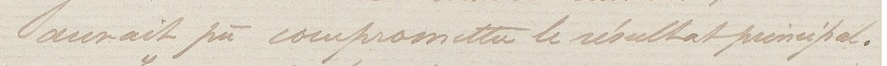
aurait pû compromettre le résultat principal.
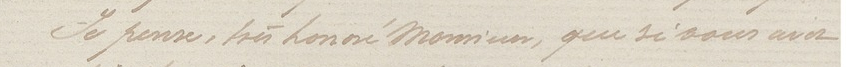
Je pense, très honoré Monsieur, que si vous avez
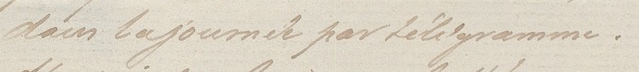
dans la journée par télégramme.
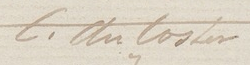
C. du Coster
